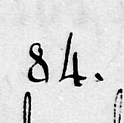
34.
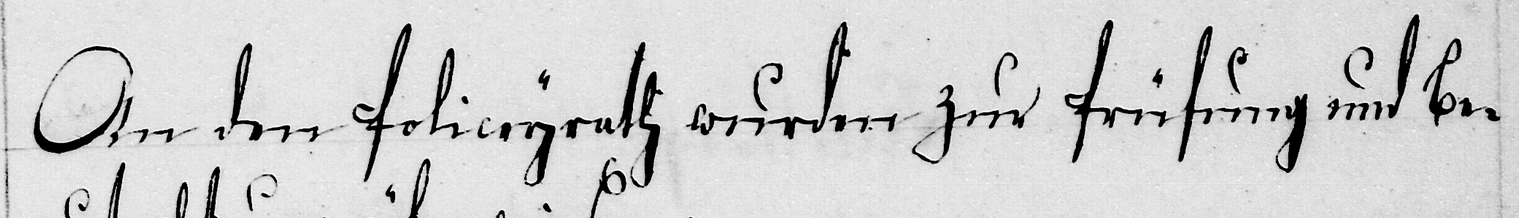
An den Policeyrath wurden zur Prüfung und Be¬
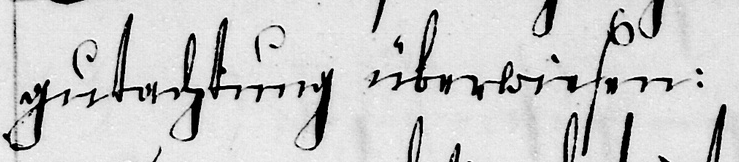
gutachtung überwiesen:
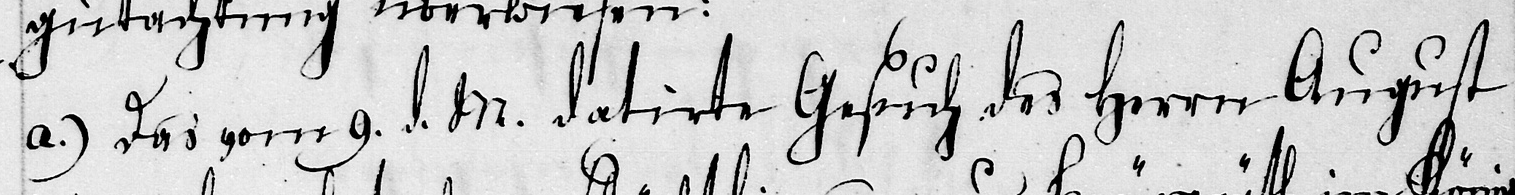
a.) Das vom 9. d. M. datirte Gesuch des Herrn August
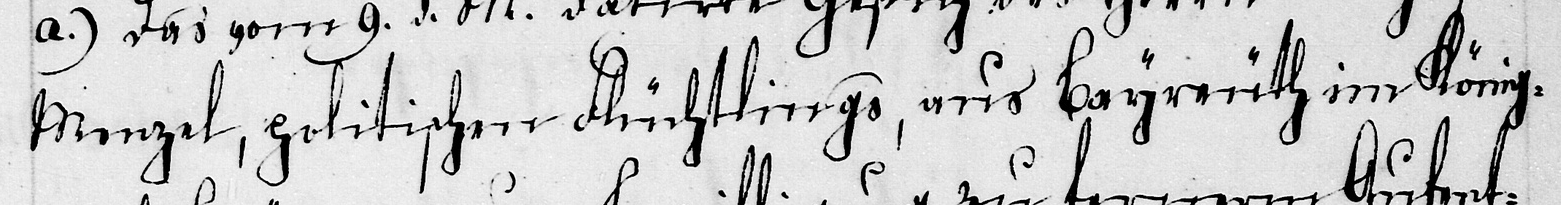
Menzel, politischen Flüchtlings, aus Bayreuth im König¬
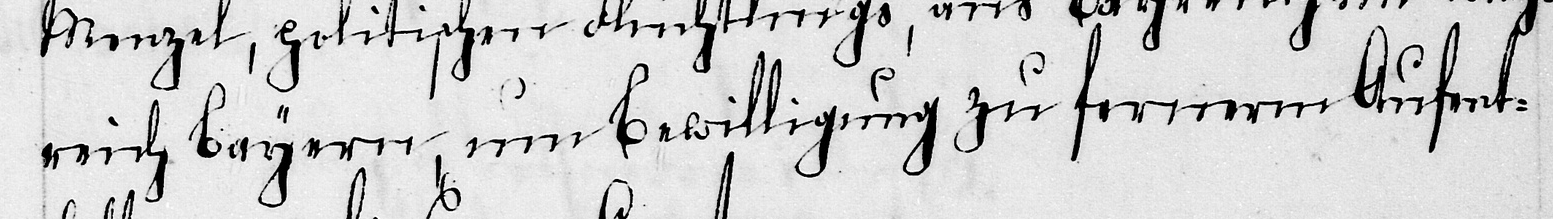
reich Bayern, um Bewilligung zu fernerm Aufent¬
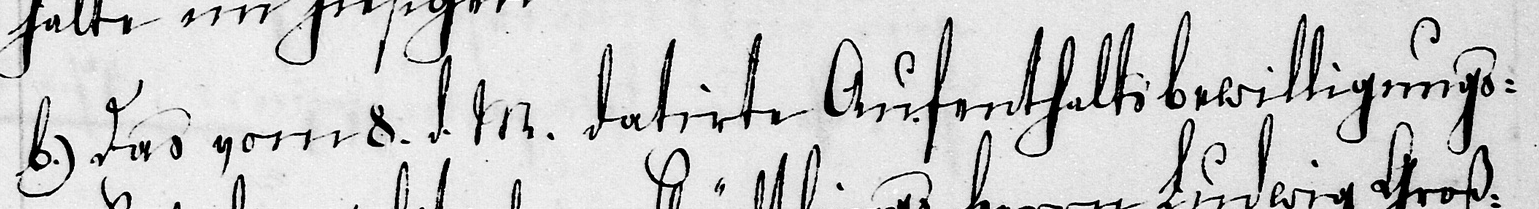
b.) Das vom 8. d. M. datirte Aufenthaltsbewilligungs¬
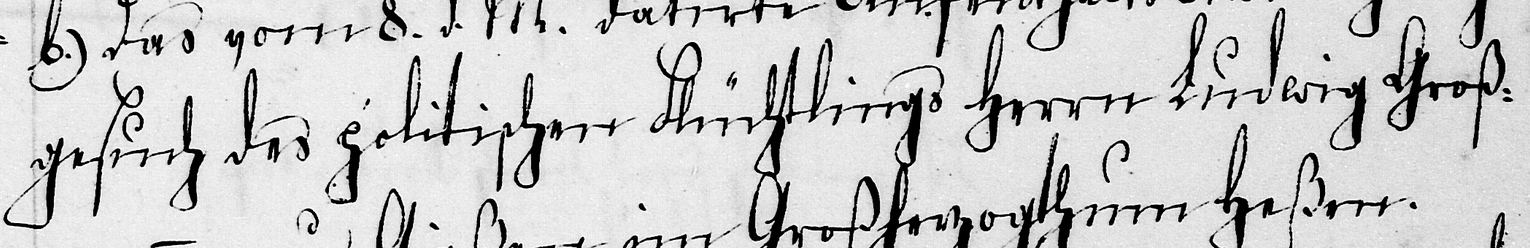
gesuch des politischen Flüchtlings Herrn Ludwig Groß¬
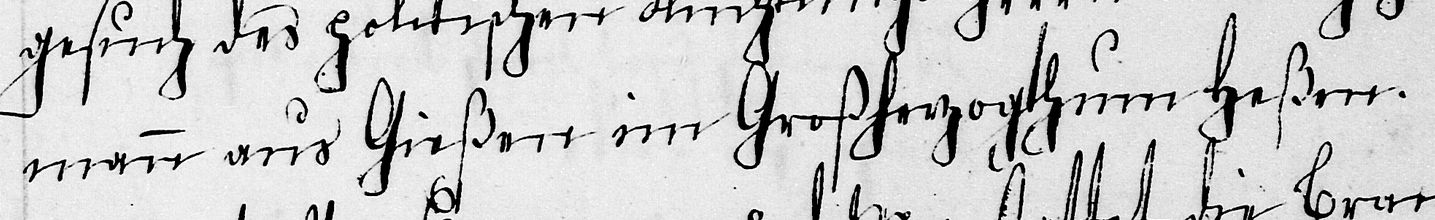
mann aus Gießen im Großherzogthum Heßen.
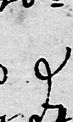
ß.
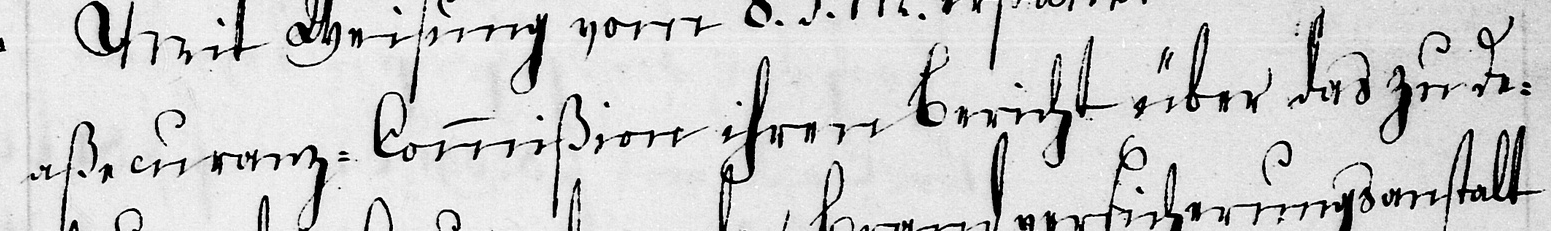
aßecuranz-Commißion ihren Bericht über das zu De¬
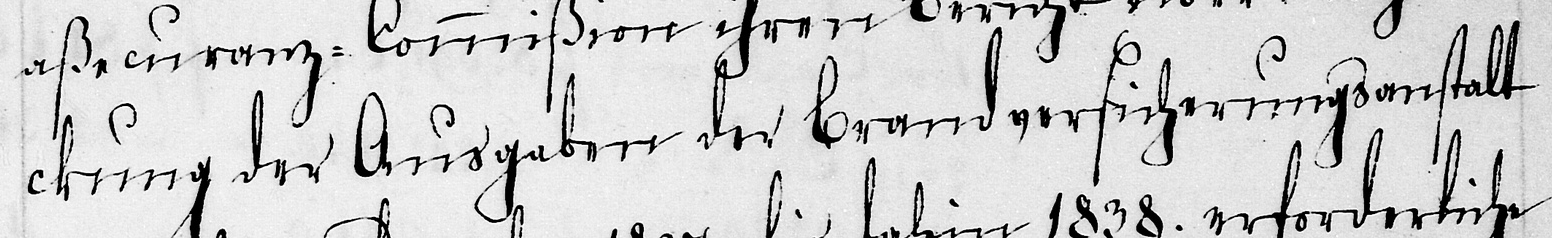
ckung der Ausgaben der Brandversicherungsanstalt
